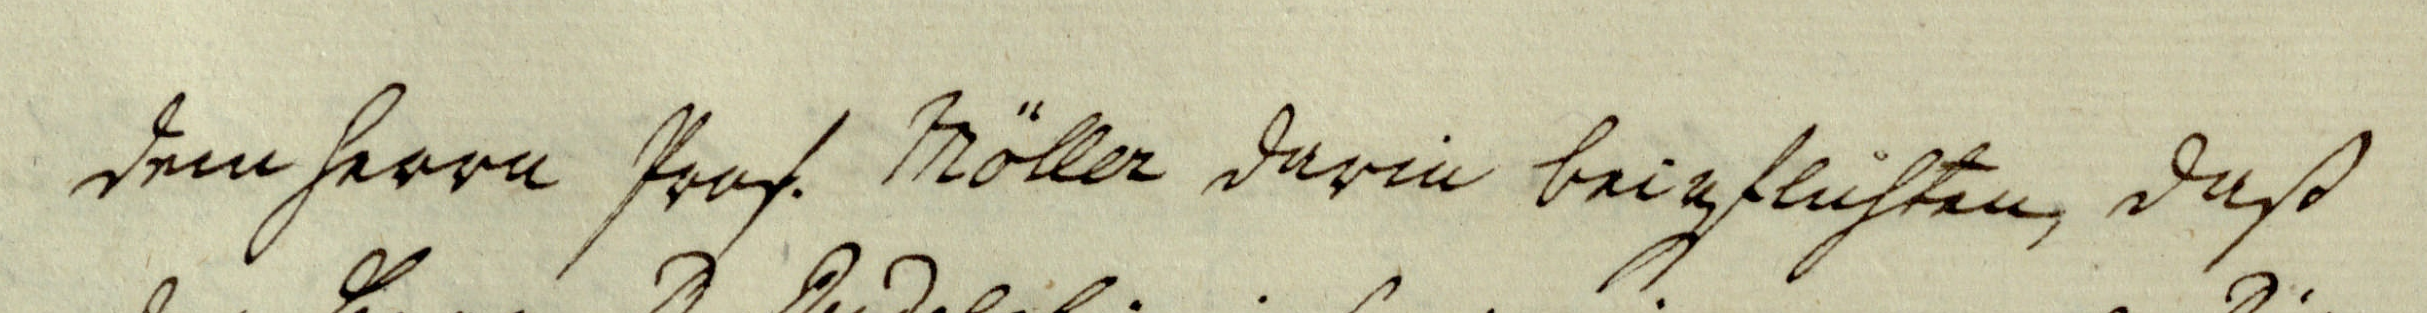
dem Herrn Prof. Möller darin beipflichten, daß
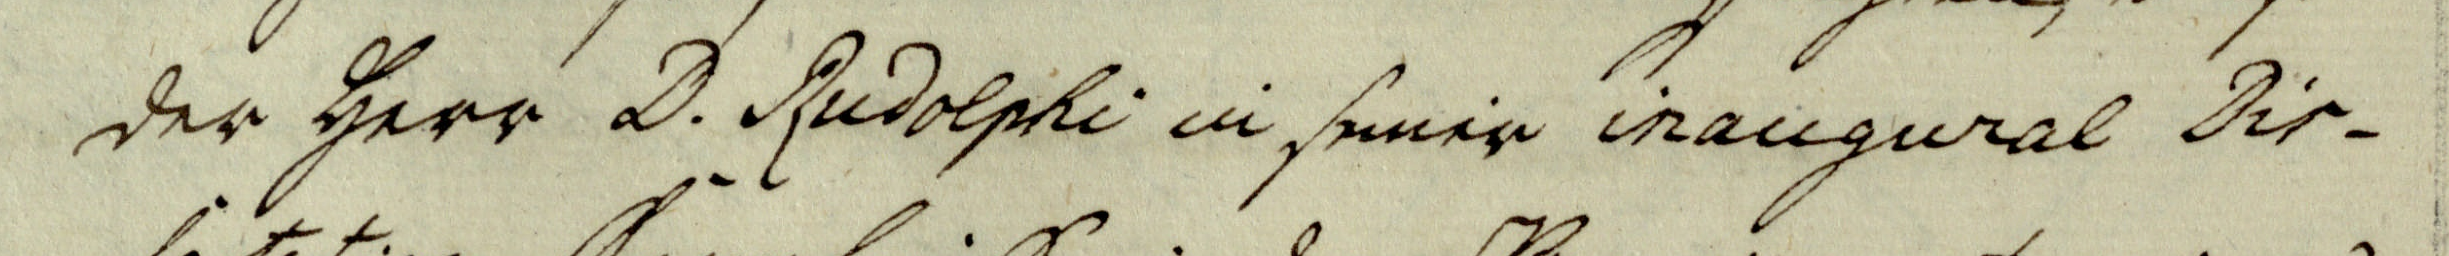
der Herr D. Rudolphi in seiner inaugural Dis¬
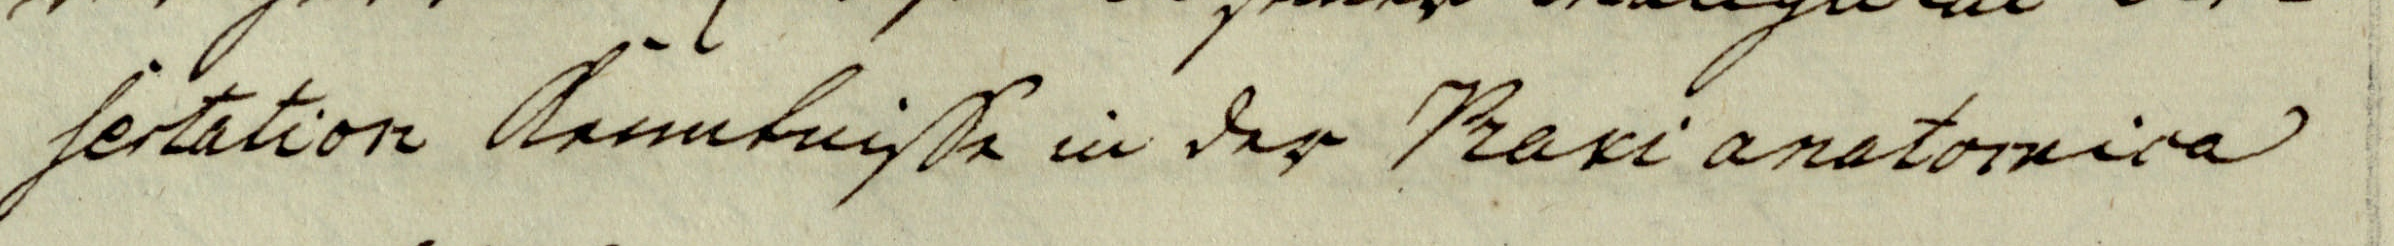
sertation Kenntnisse in der Praxi anatomica
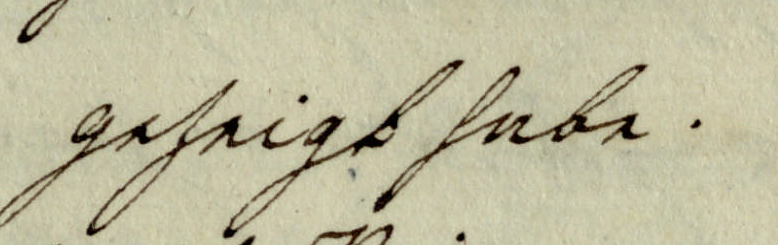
gezeigt habe.
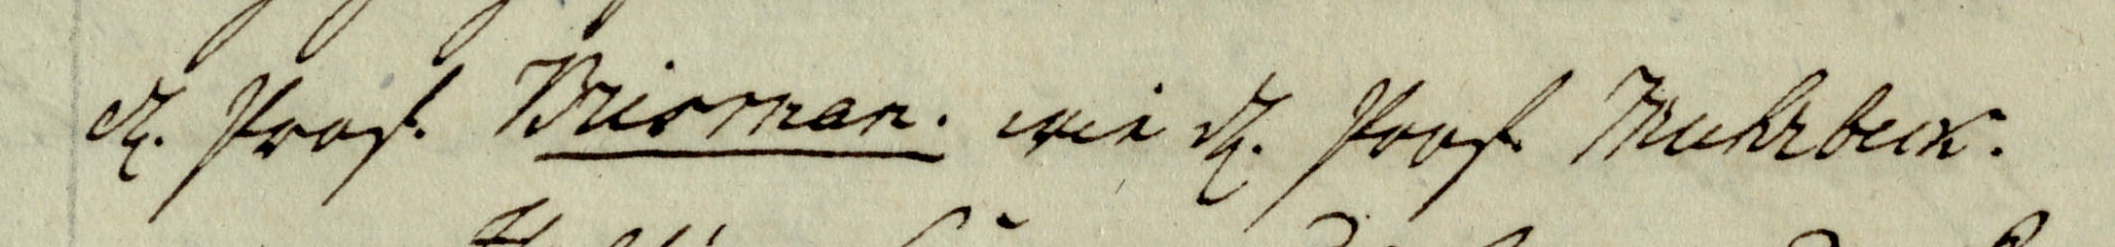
dh. Prof. Brisman. wie dh. Prof. Muhrbeck.
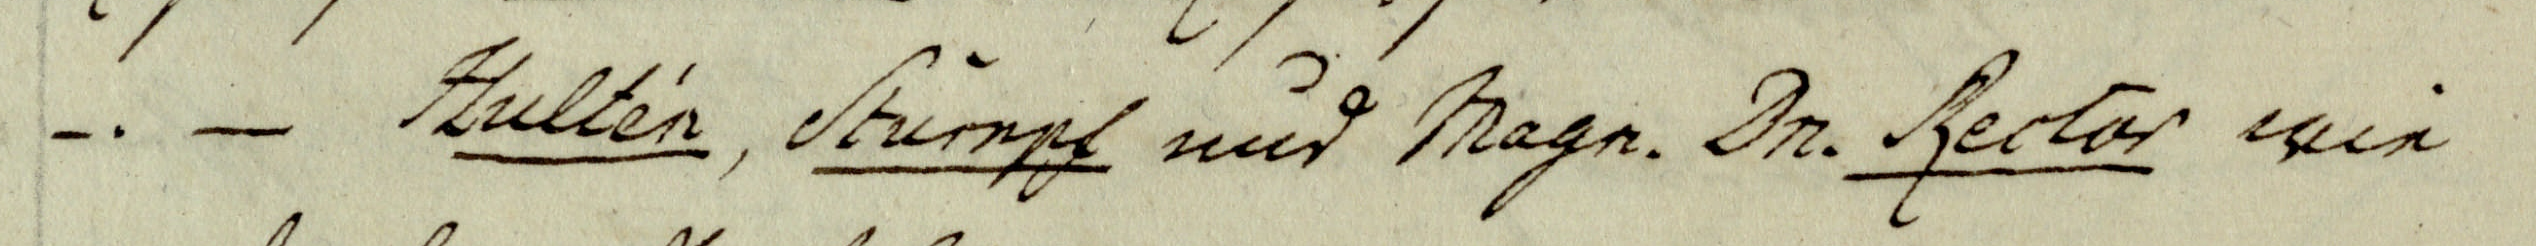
Hultén, Stumpf und Magn. Dn. Rector wie
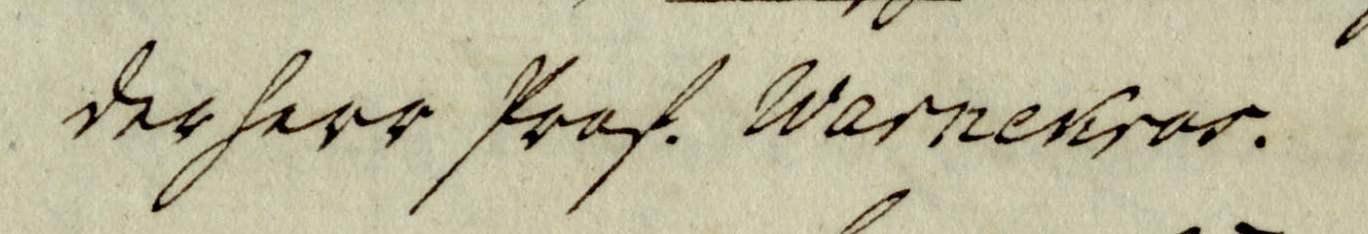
der Herr Prof. Warnekros.
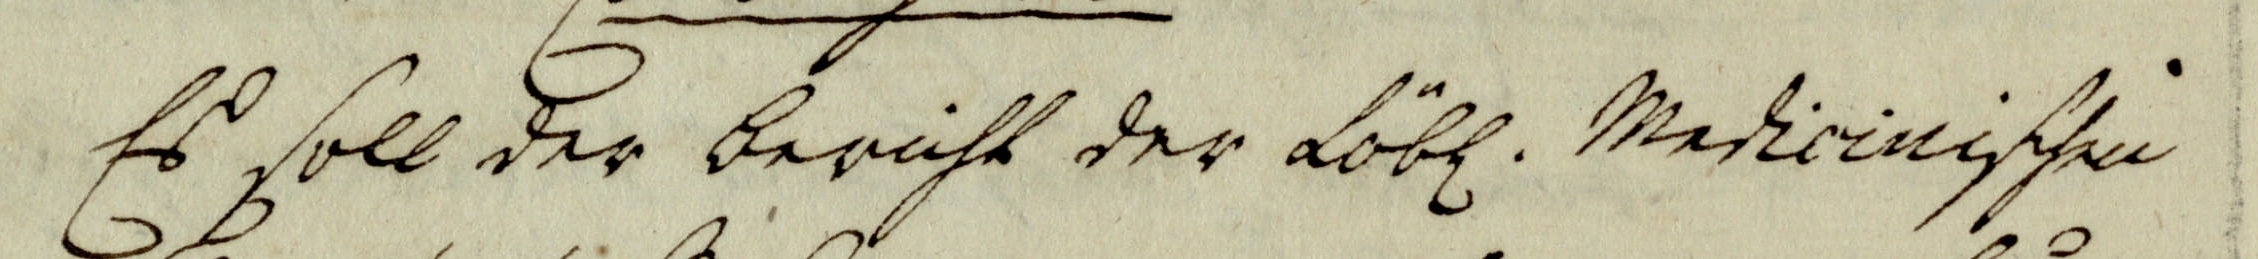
Es soll der Bericht der Löbl. Medicinischen
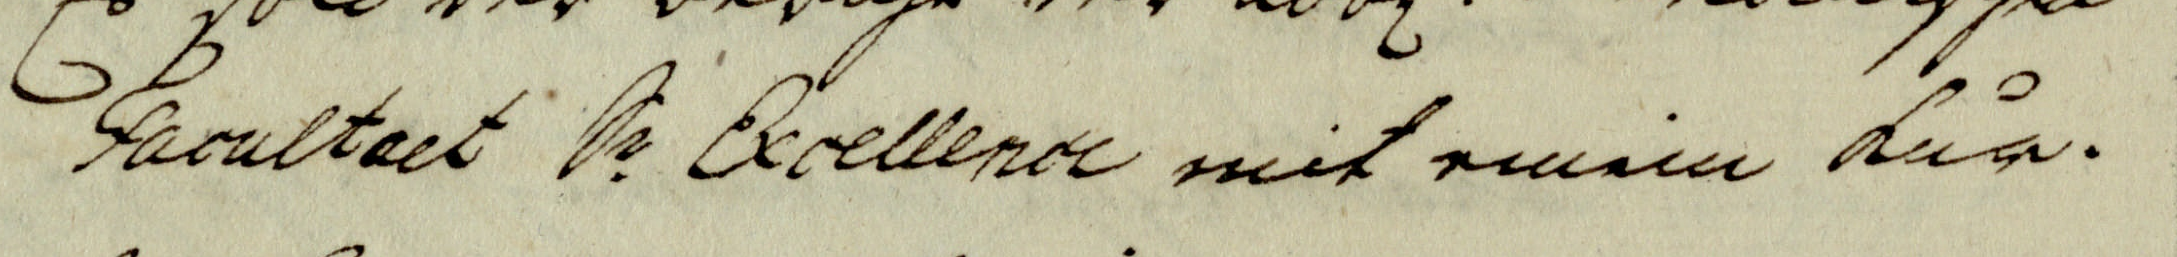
Facultaet Sr Excellence mit einem kur¬
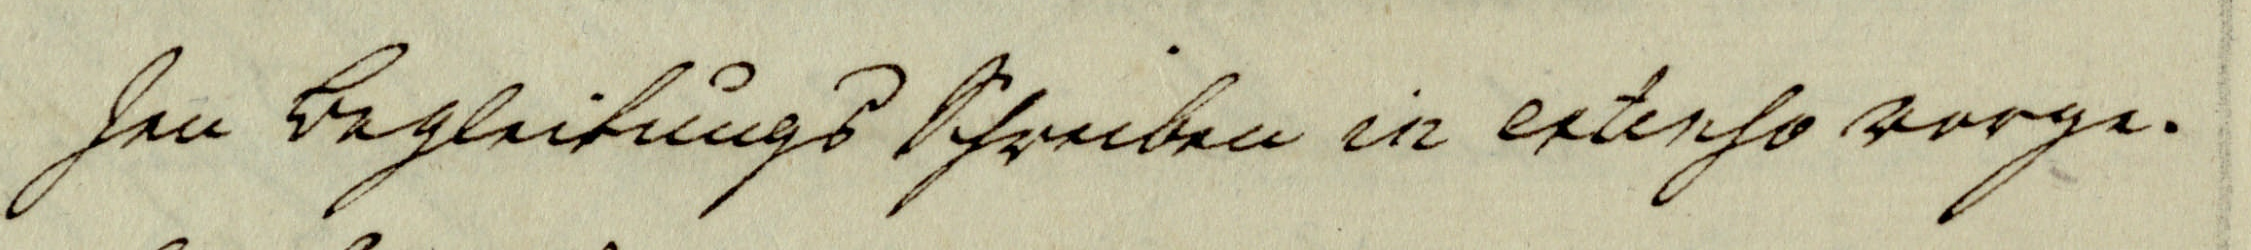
zen Begleitungs Schreiben in extenso vorge¬
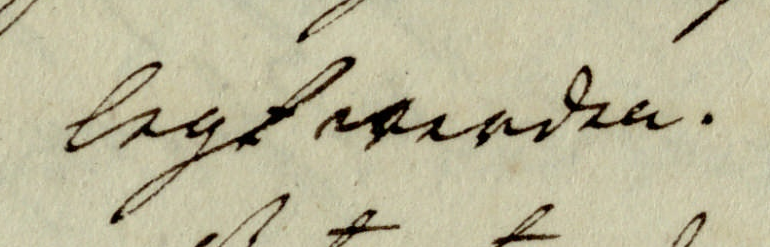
legt werden.
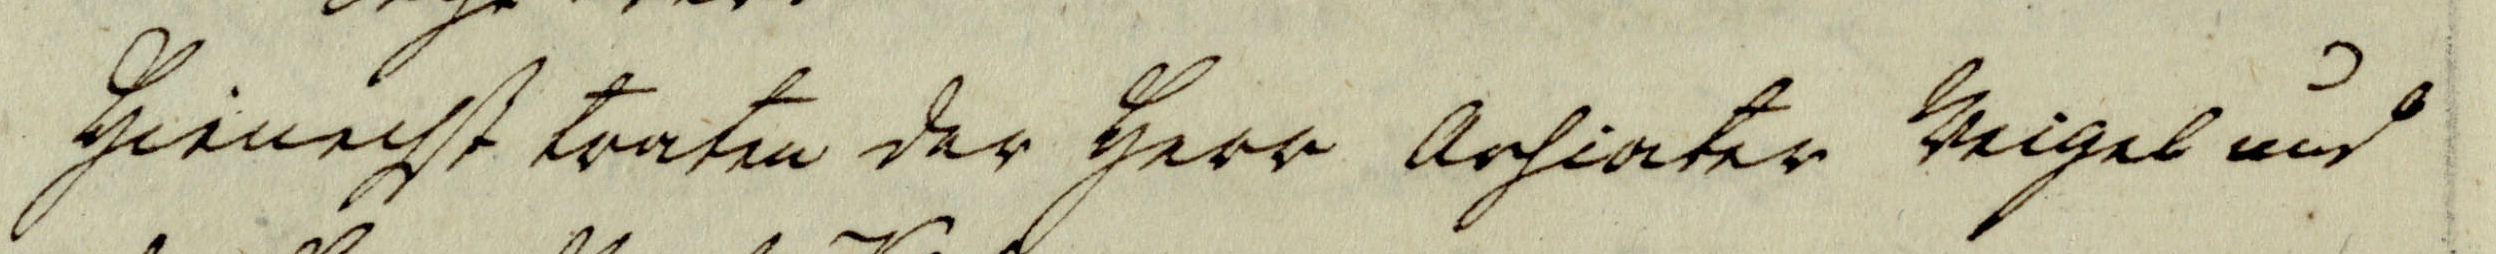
Hienechst traten der Herr Archiater Weigel und
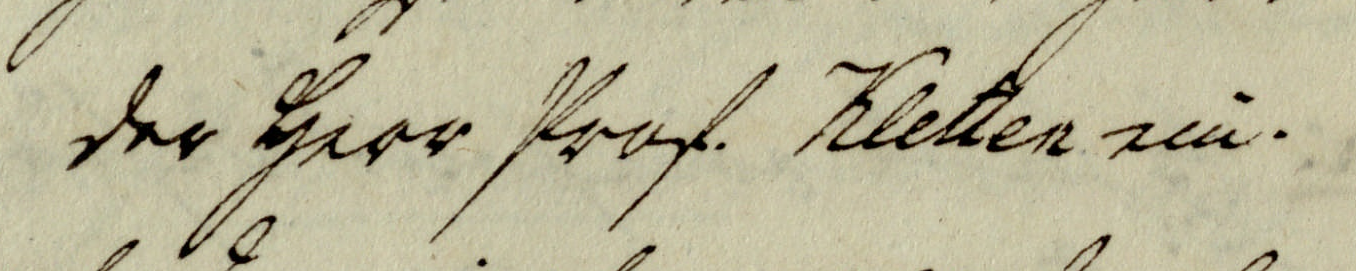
der Herr Prof. Kletten ein.
